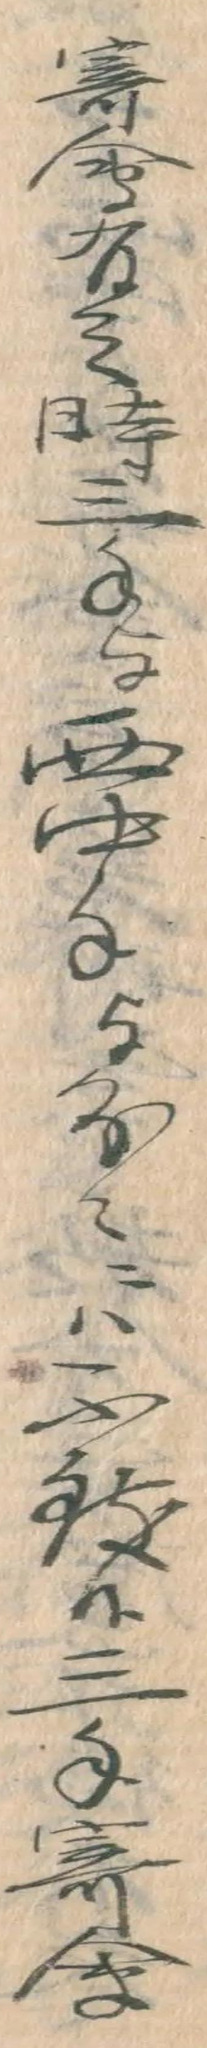寄會有之時三手と西中手与分〻ニハ不致候三手寄會

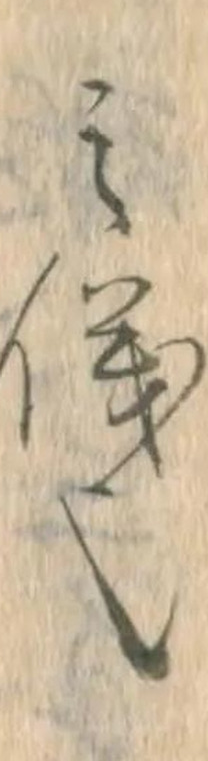之義也
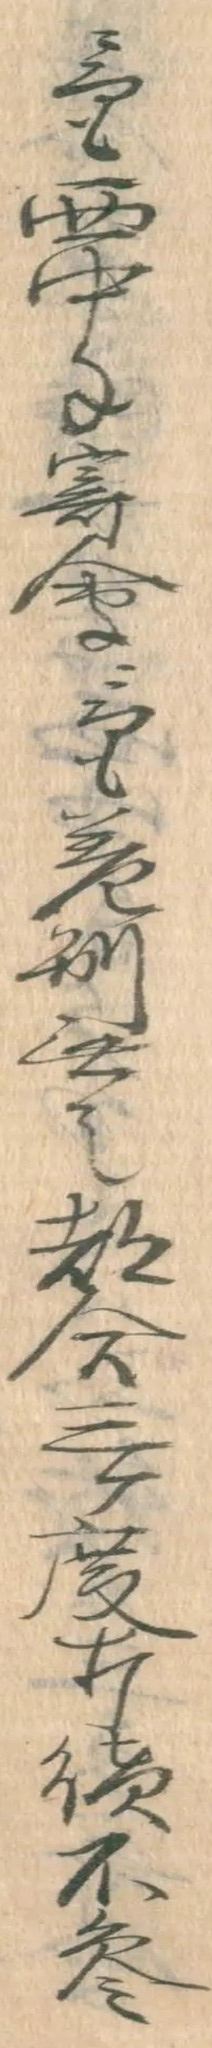二而も西中手寄會ニ而も差別無之都合三ケ度打續不参
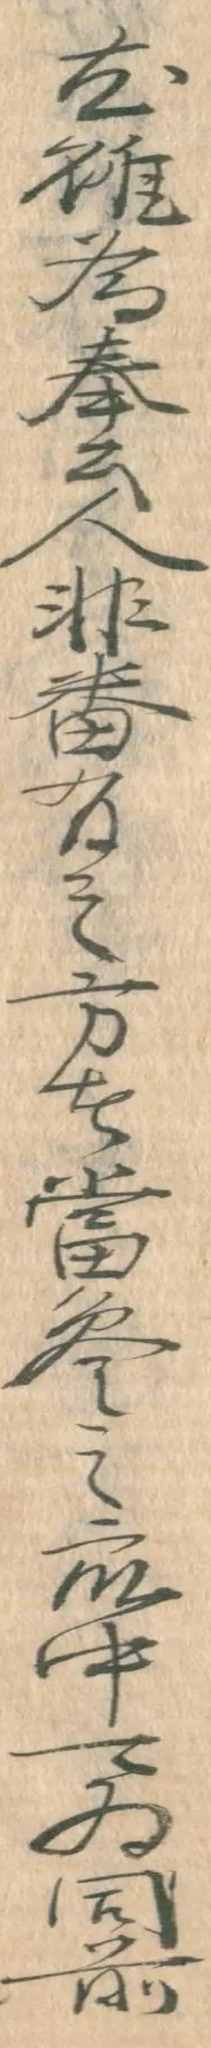尤雖為奉公人非番有之方者當参之衆中可為同前
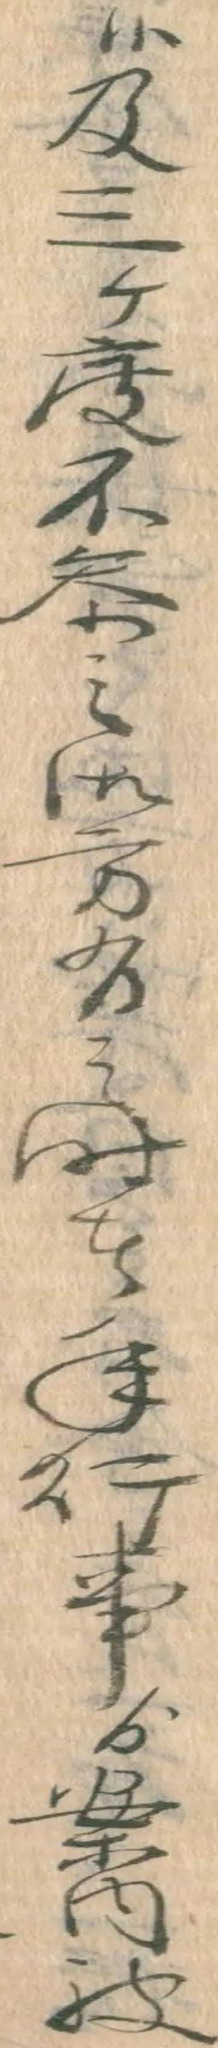候及三ケ度不参之御方有之時は年行事より案内致
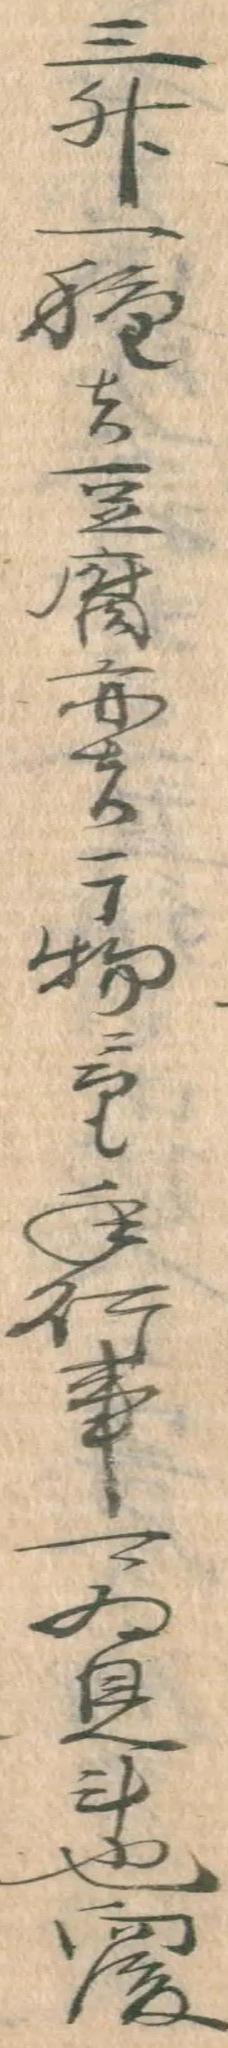三升一種は豆腐亦は干物ニ而も年行事可為見斗也向後
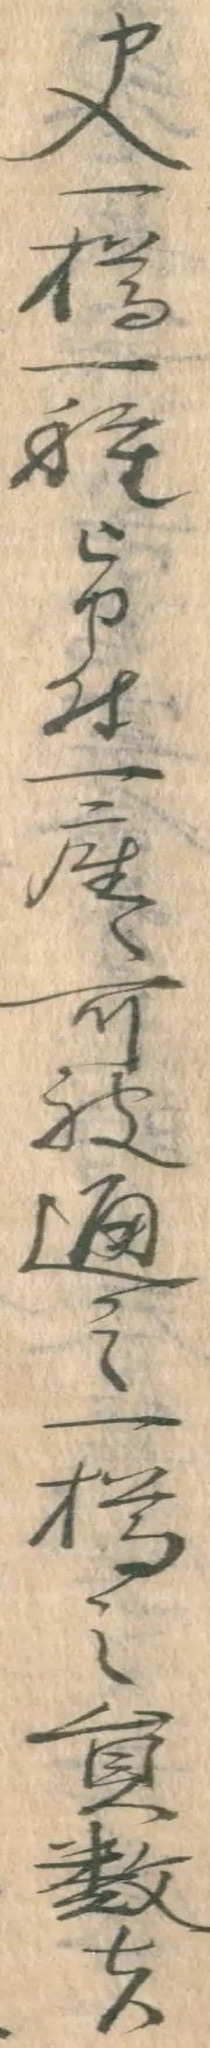申入一樽一種被申付一座候可被通之一樽之員数は
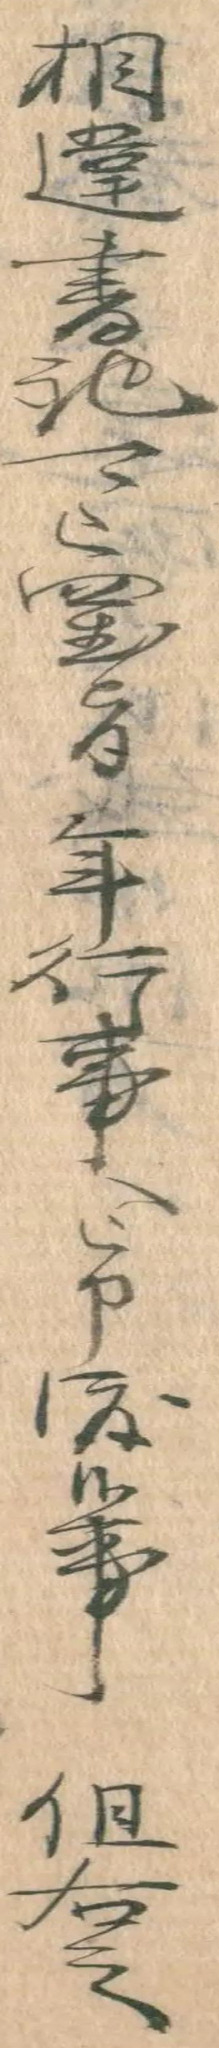相違書記可被置旨年行事へ被申渡候事但右之
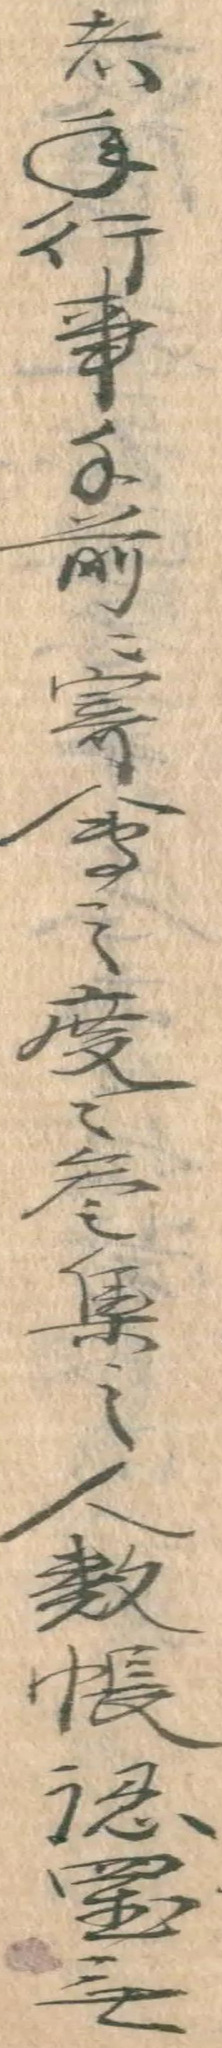者年行事手前ニ寄會之度々参集之人数帳認置無
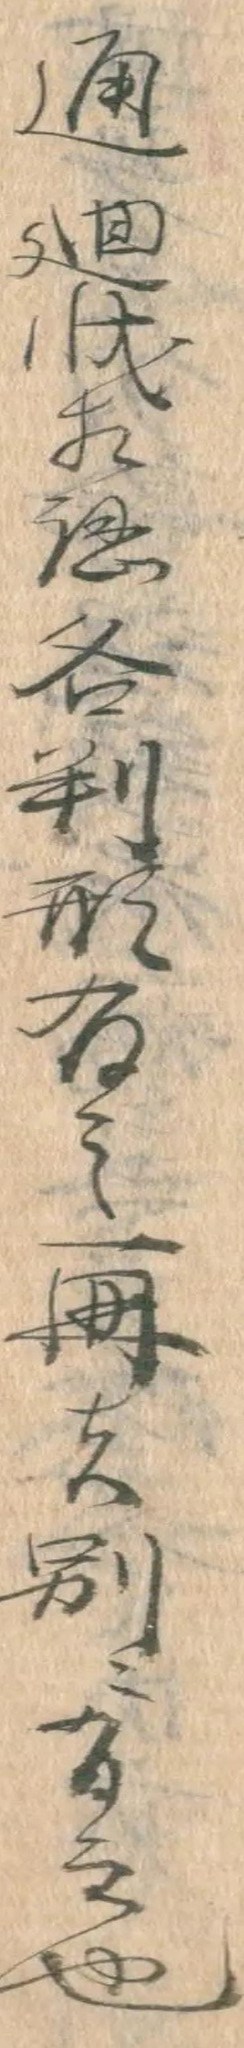通廻状相認各判形有之一冊は別ニ有之也
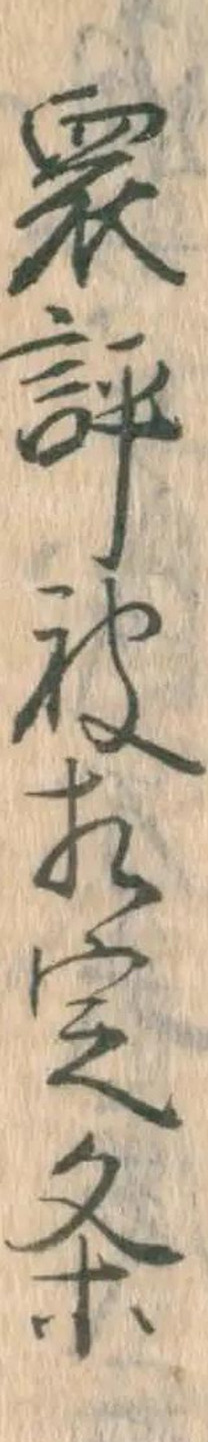衆評被相定条
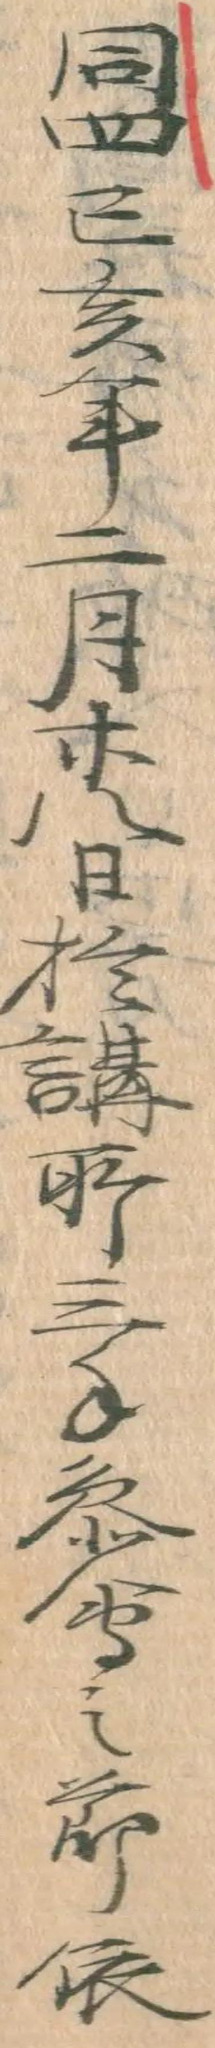同四己亥年二月廿八日於講所三手参會之節依
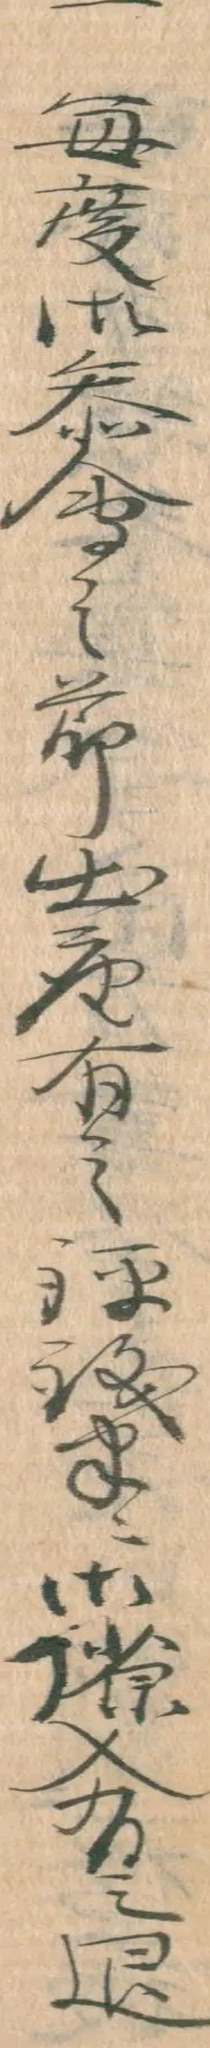一毎度御参會之節出座有之評議半ニ御隙入有之退
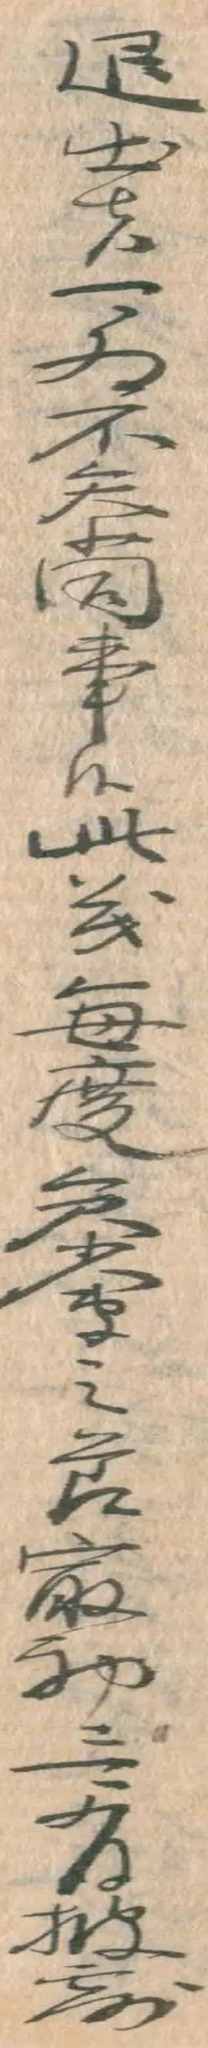退出者可為不参同事候此義毎度参會之節最初ニ可有披露
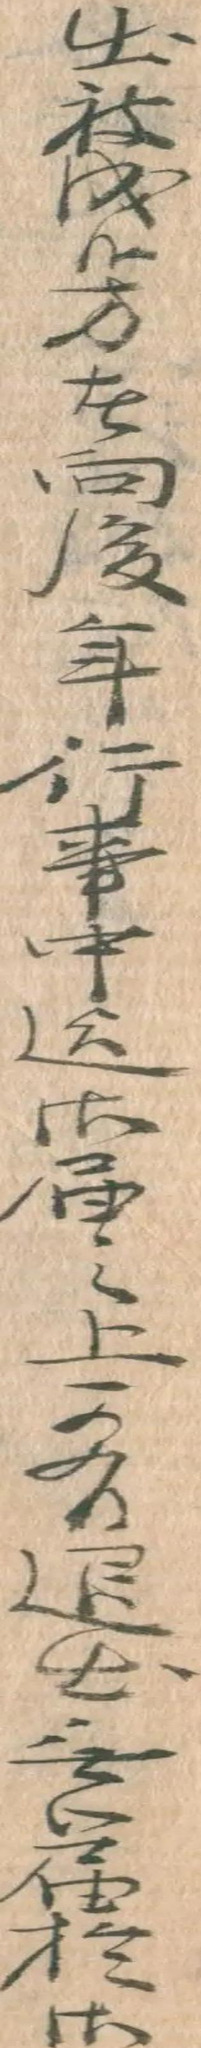出被成候方は向後年行事中迄御届之上可有退出無御届於御
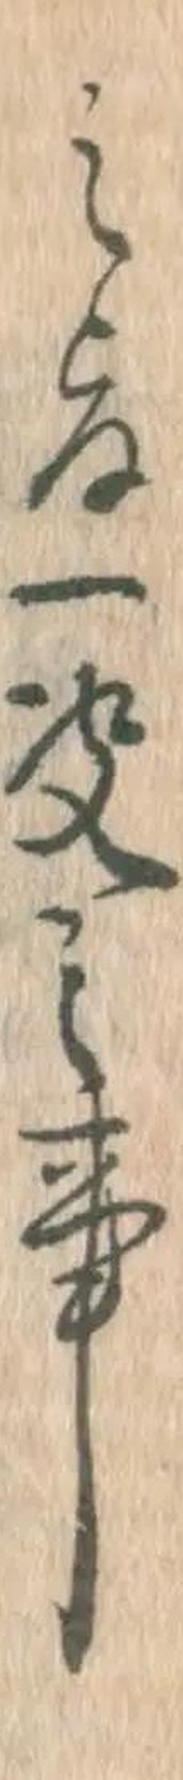之旨一決之事
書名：賀茂社記録. 第29冊
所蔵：国立国会図書館 National Diet Library, JAPAN
